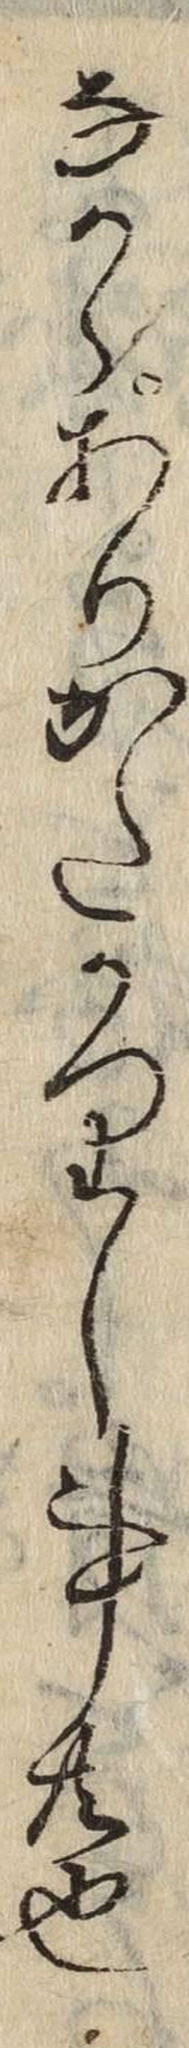なから。ありかたかりし事共也
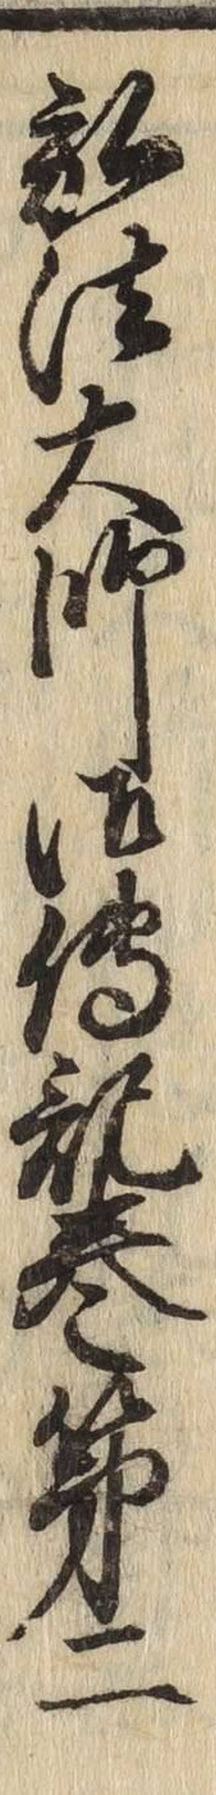弘法大師御伝記巻第二
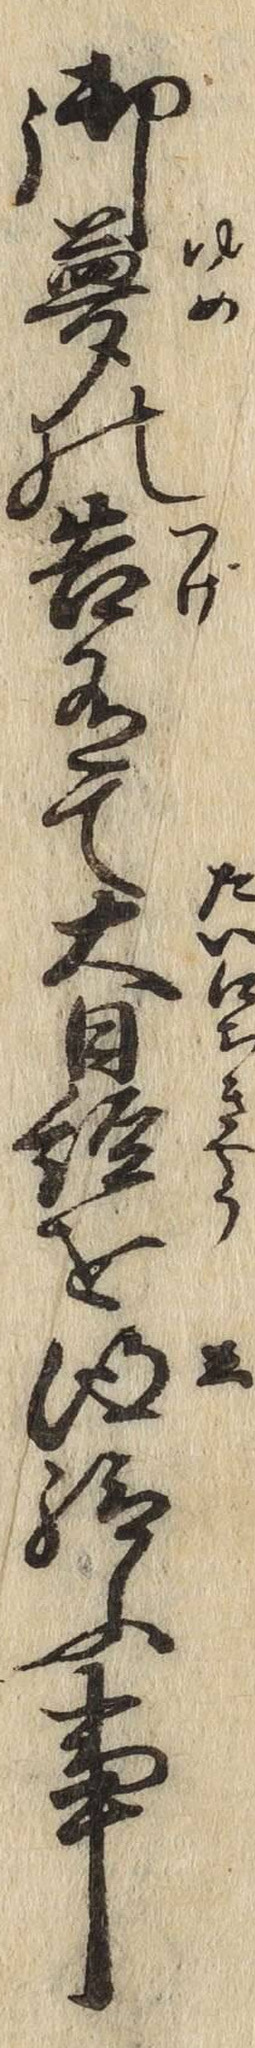御夢の告有て大日経を得給ふ事
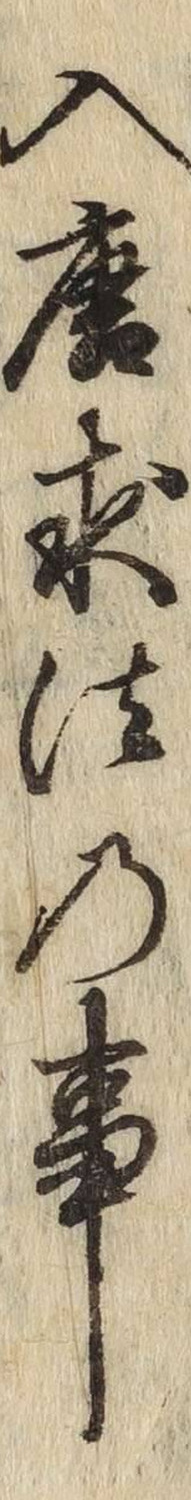入唐求法の事
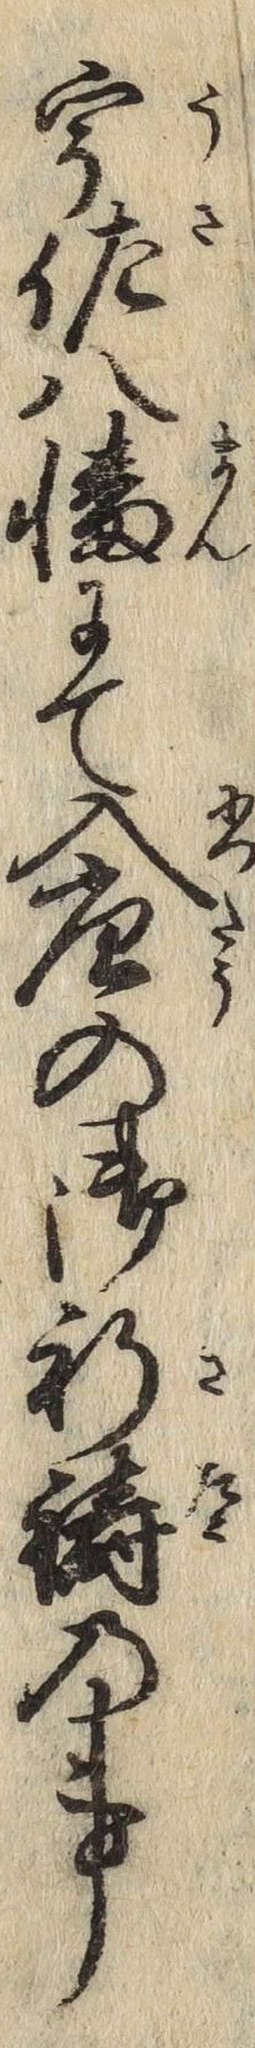宇佐八幡にて入唐の御祈祷の事
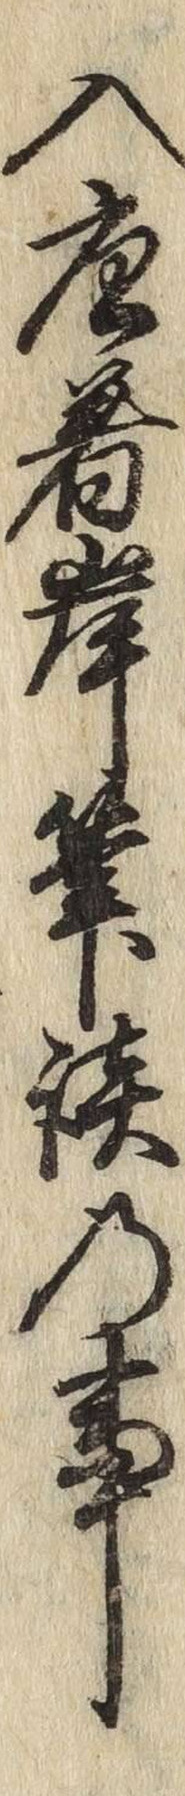入唐着岸筆談の事
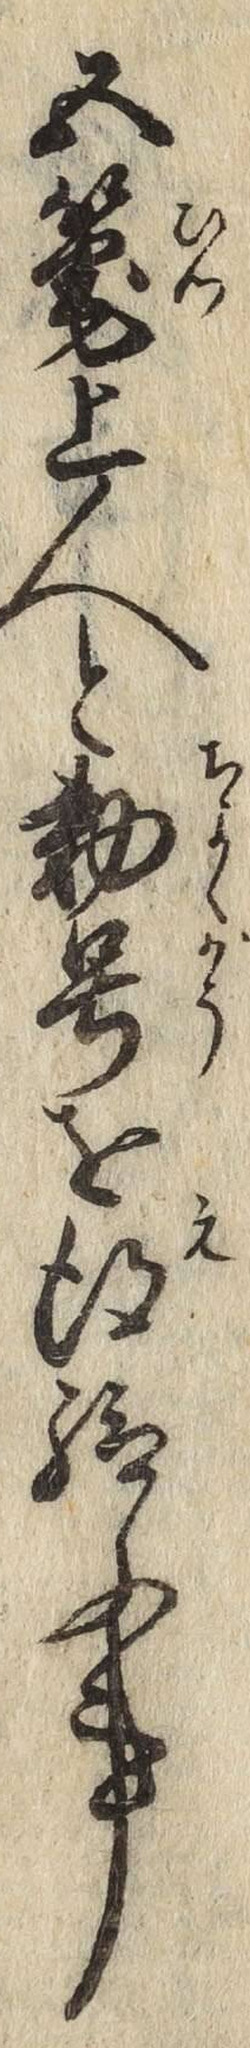五筆上人と勅号を得給ふ事
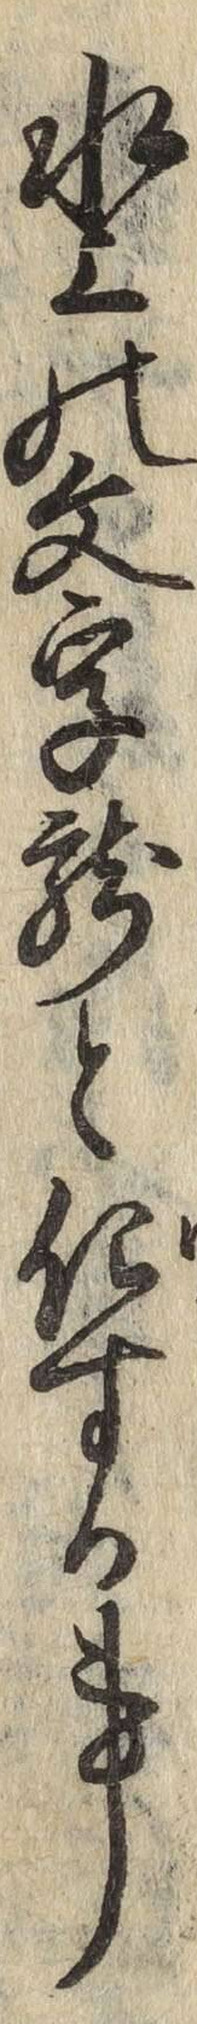水上の文字竜と化する事

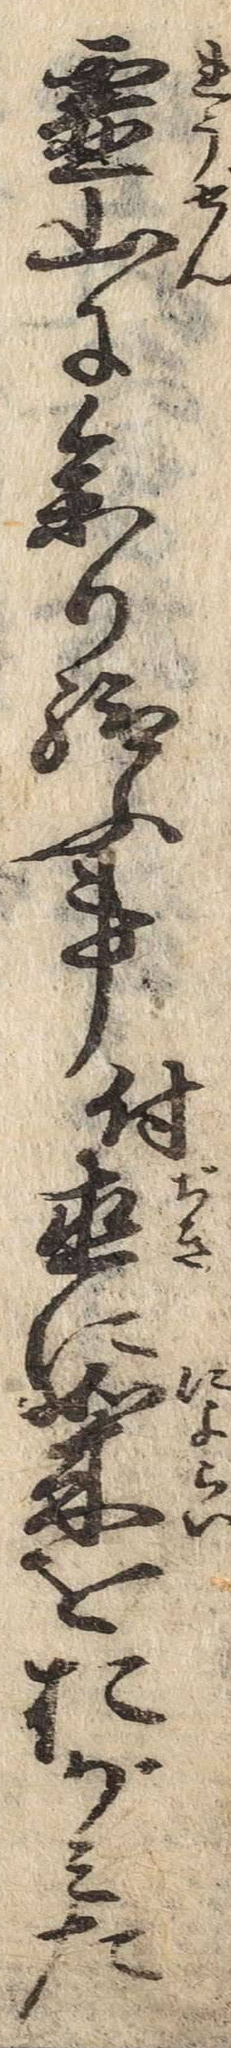霊山に参り給ふ事付直に如来をおがみた
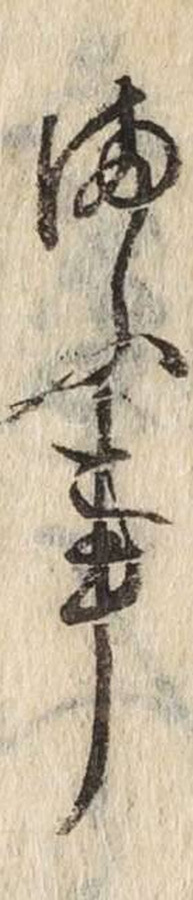まふ事
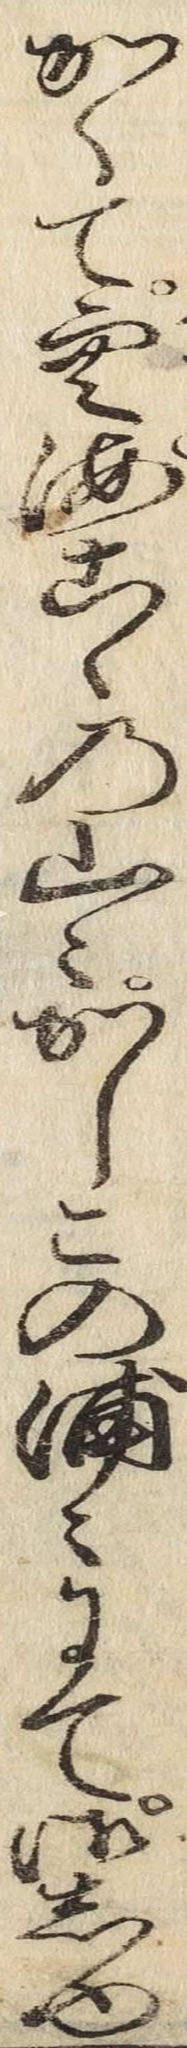かくて。空海こゝの山々。かしこの浦々にて。御しゆ
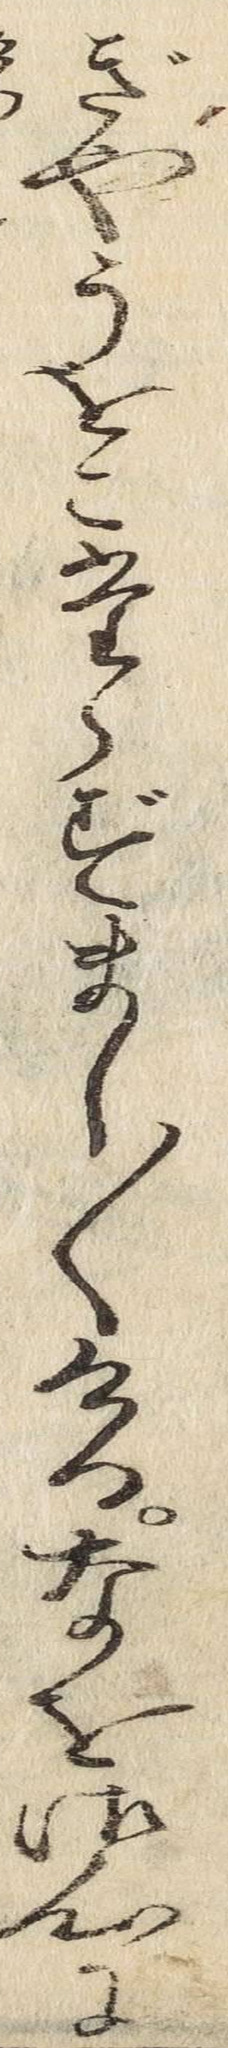ぎやうをこたらずまし〳〵ける。なを御心に
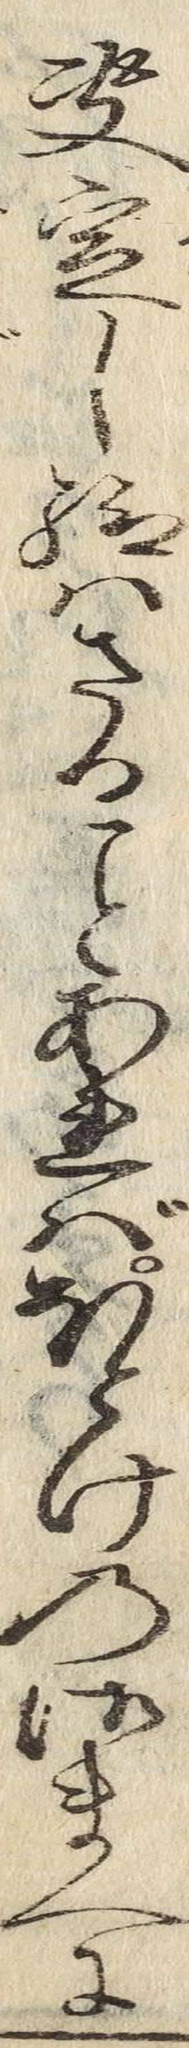決定し給はさることあれば。ほとけの御まへに
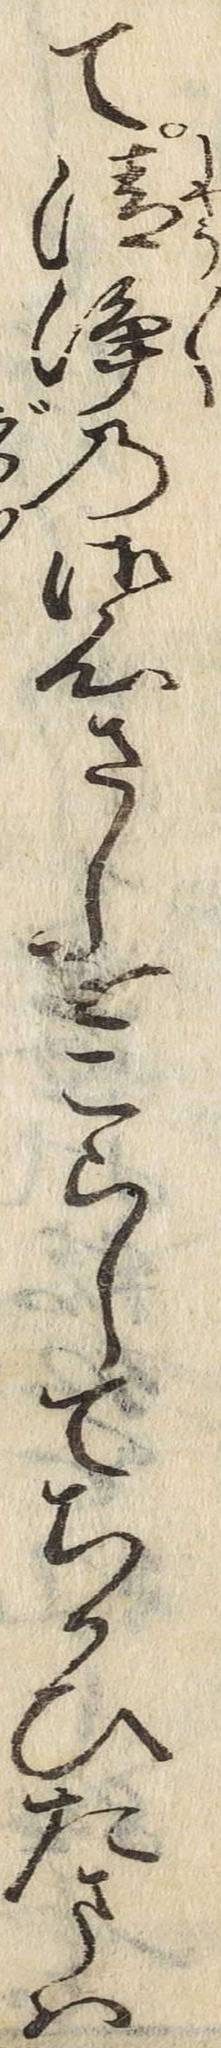て清浄の御心さしをこらしてちかひたまは
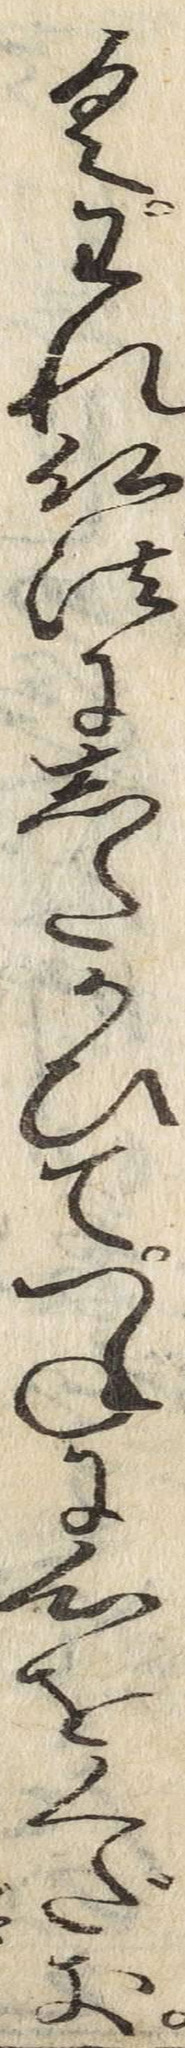く。われ仏法にしたかひて。つねに心をくだき。
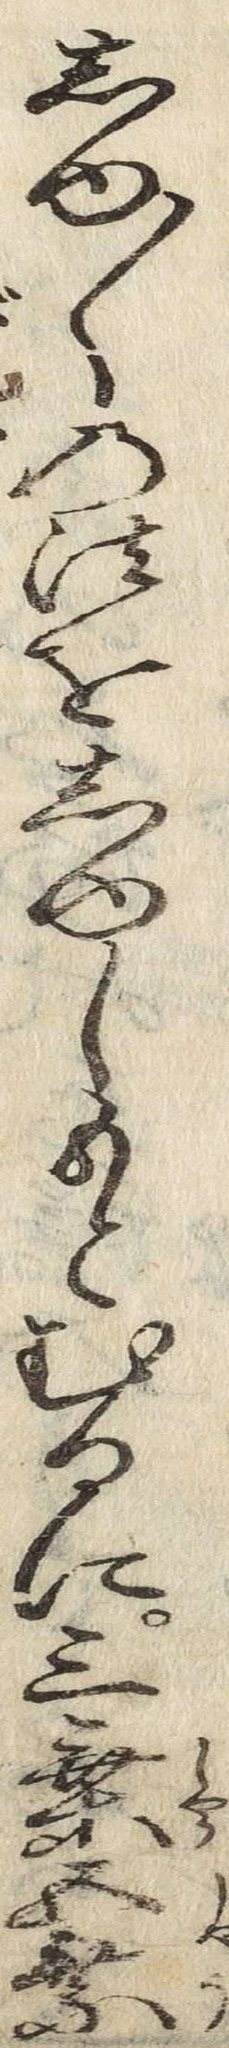しゆ〳〵の法をしゆしもとむるに。三葉五葉
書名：弘法大師御傳記
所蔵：京都府立京都学・歴彩館 国文学研究資料館
